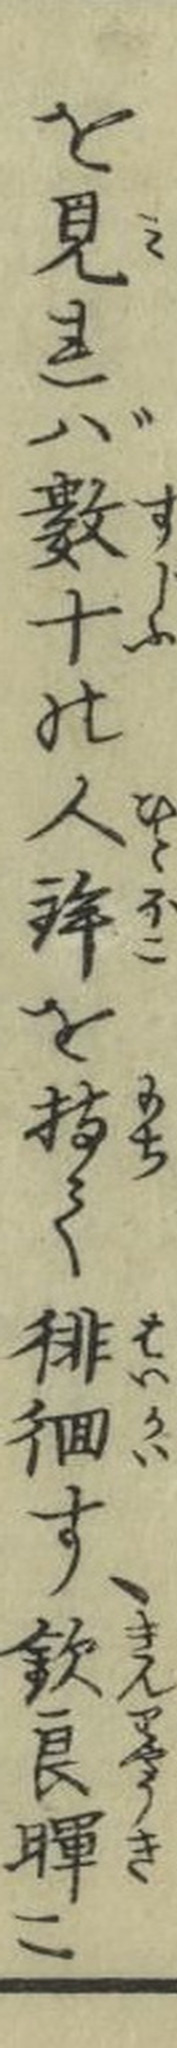を見れば数十の人鉾を持て徘徊す、欽良暉こ
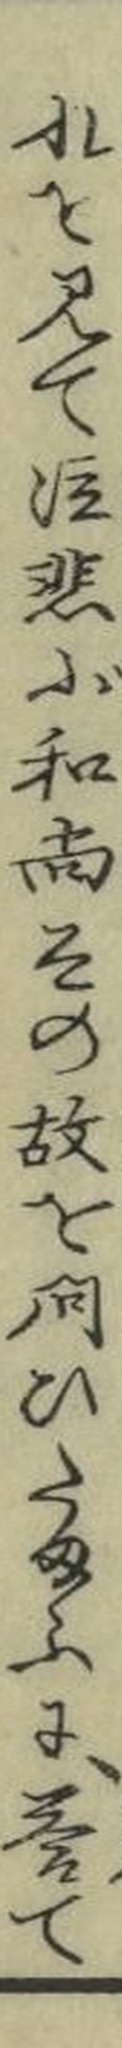れを見て泣悲ぶ、和尚その故を問ひたひたまふに、答て

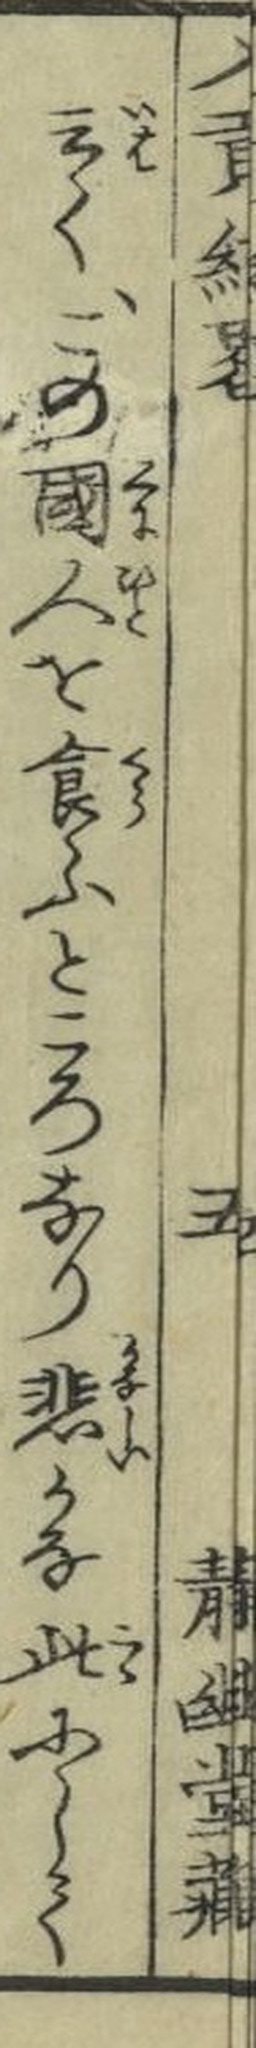云く、この国人を食ふところなり悲かな此にして
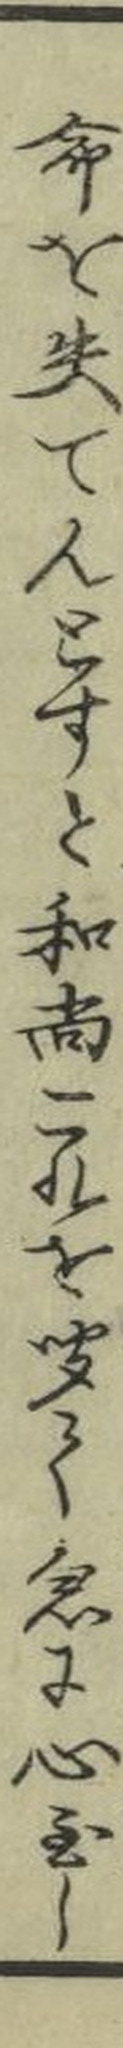命を失てんとすと、和尚これを聞て忽に心至し
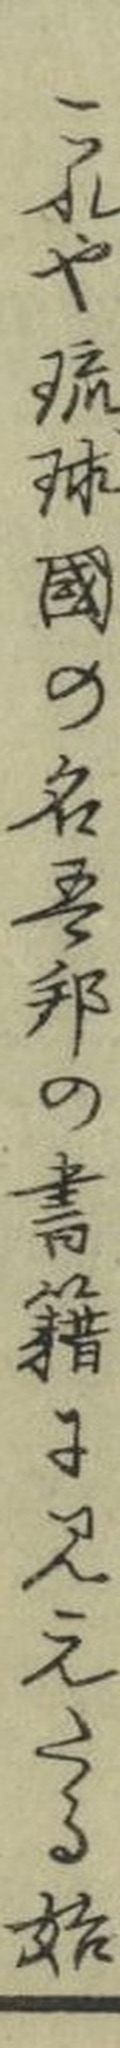これや琉球国の名、吾邦の書籍に見えたる始
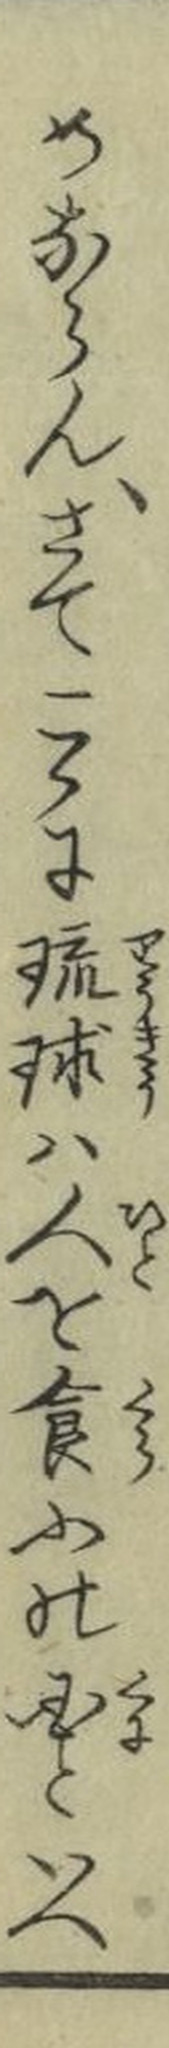めならん、さてこゝに琉球は人を食ふの国といへ
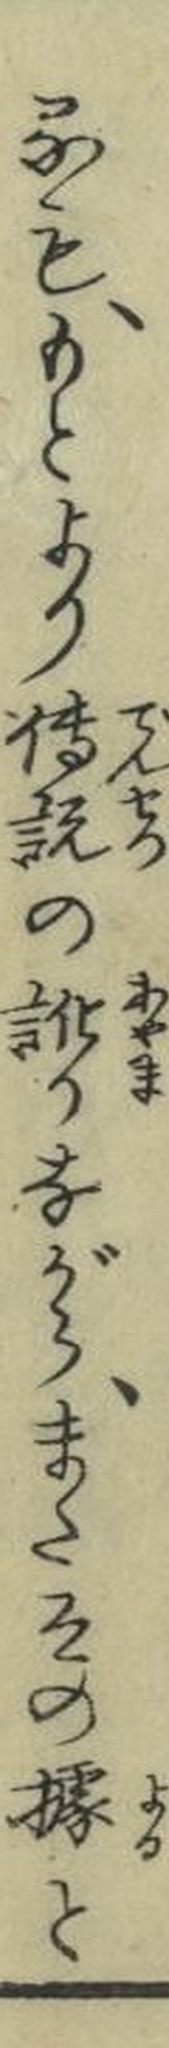るも、もとより伝説の訛りながら、またその拠と
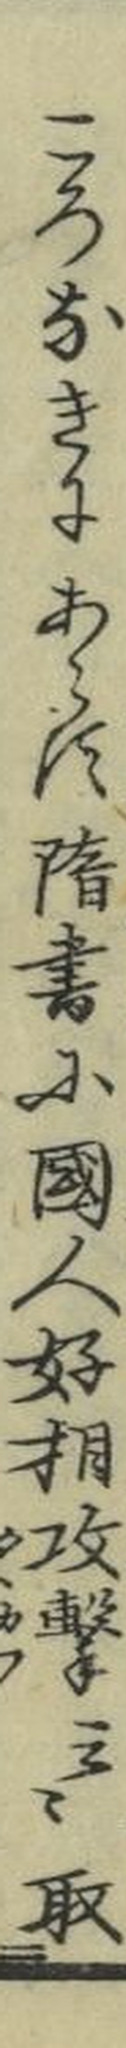ころなきにあらず、隋書に国人好相攻撃云々、取
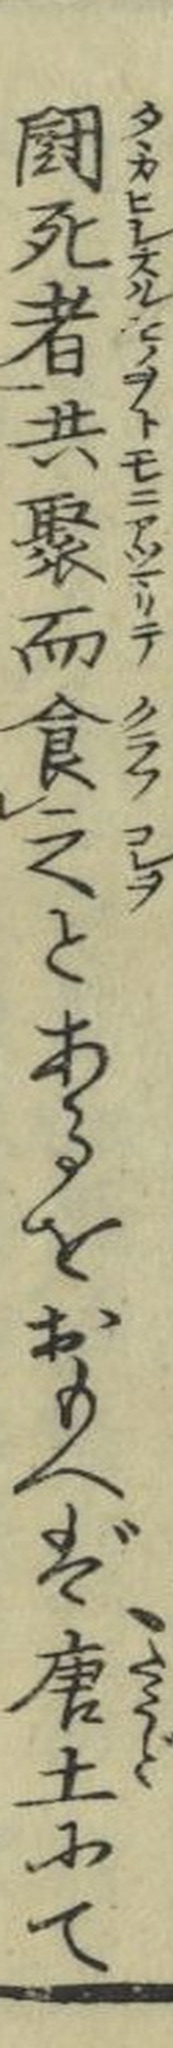闘死者共聚而食之とあるをおもへば、唐土にて
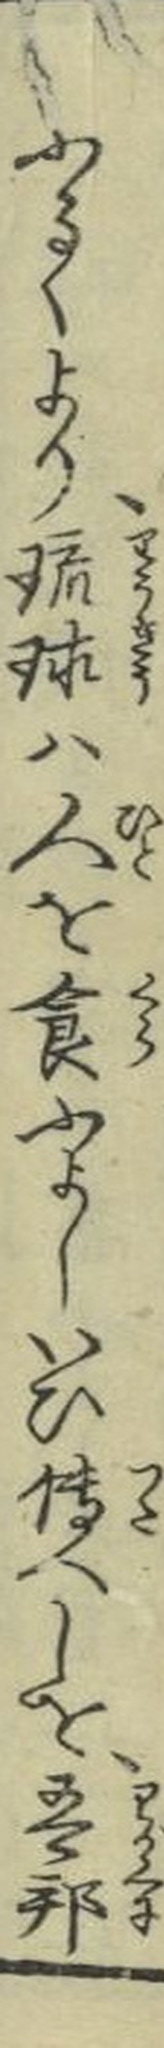ふるくより、琉球は人を食ふよしいひ伝へしを、吾邦
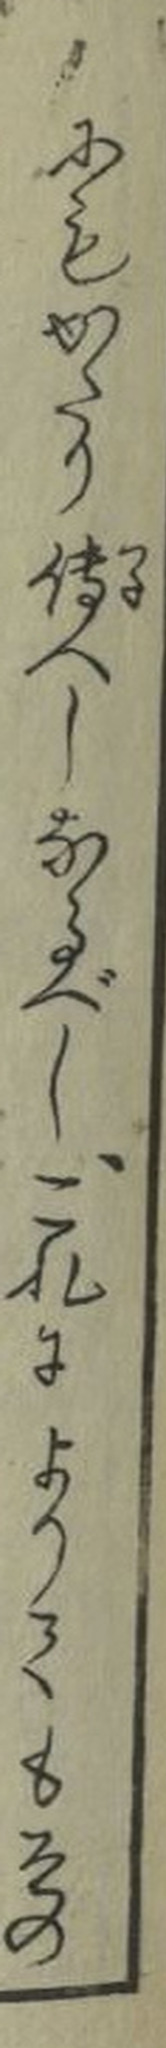にもかたり伝へしなるべし、これによりてもその
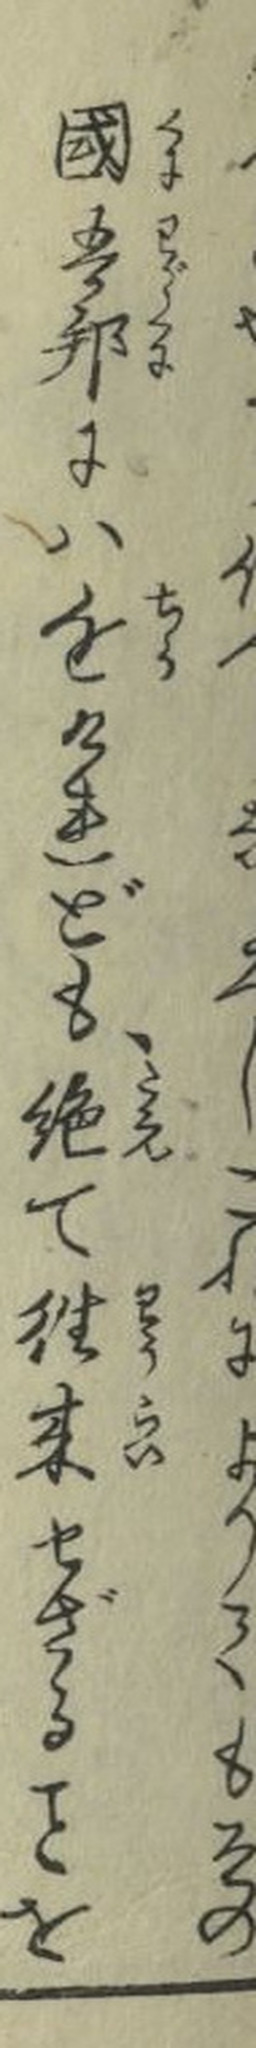国吾邦には近けれども、絶て往来せざることを
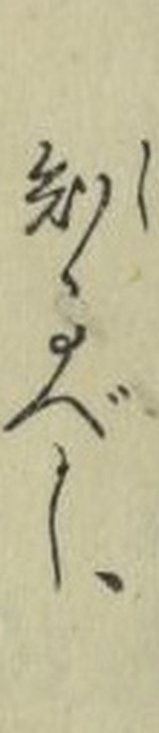知るべし、
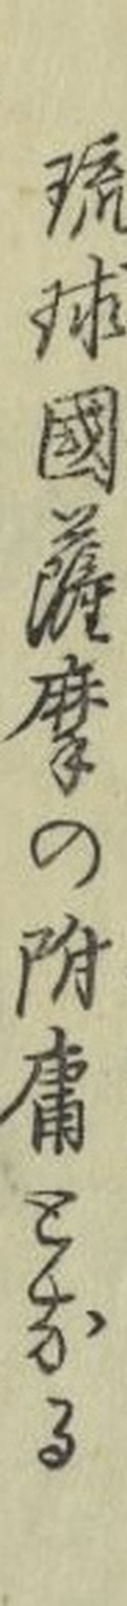琉球国薩摩の附庸となる
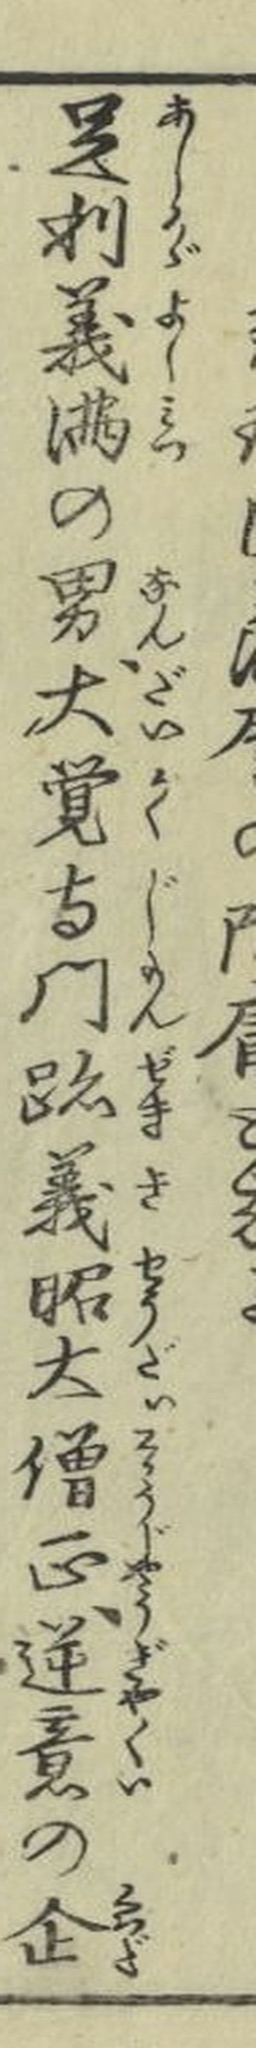足利義満の男、大覚寺門跡義昭大僧正、逆意の企
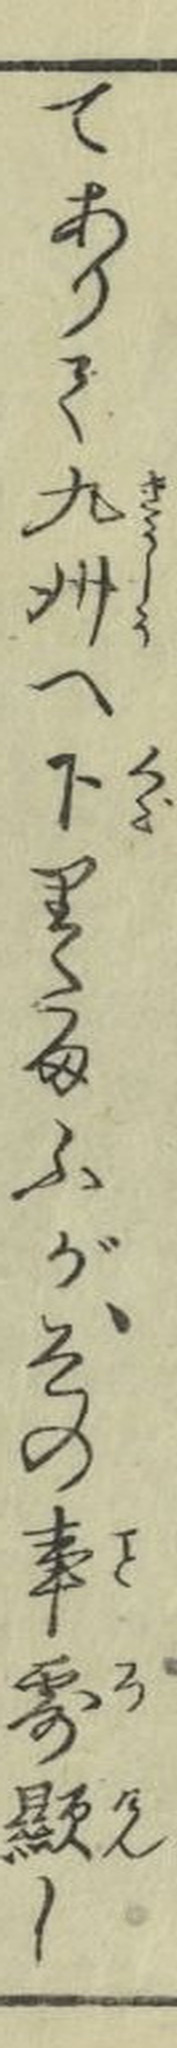てありて九州へ下りたまふが、その事露顕し
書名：琉球入貢紀略
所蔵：University of the Ryukyus Library
